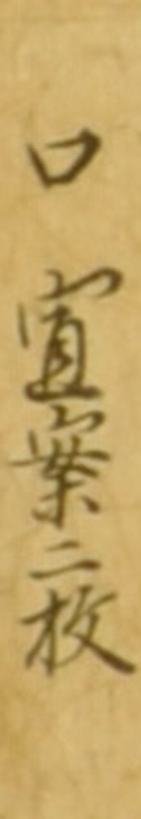口宣案二枚
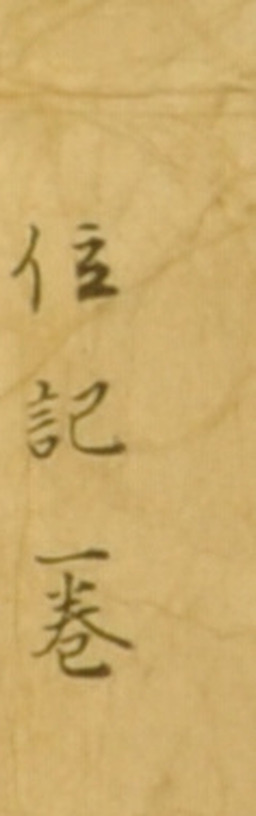位記一巻

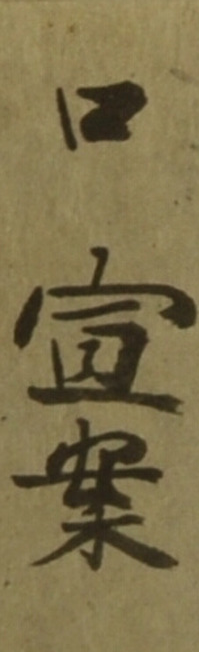口宣案
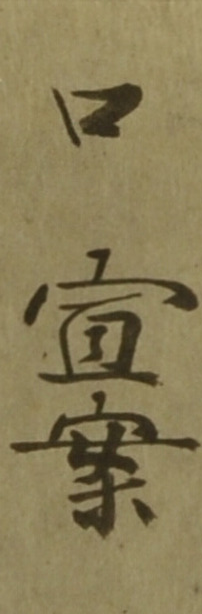口宣案

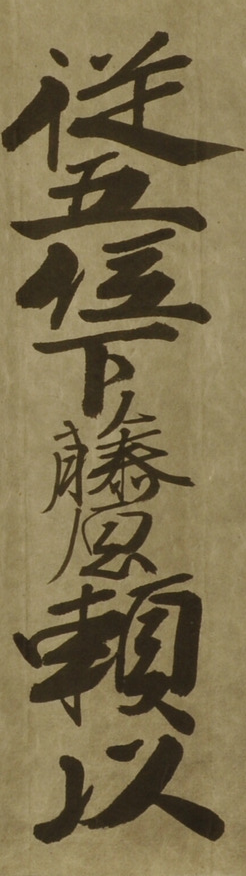従五位下藤原頼以
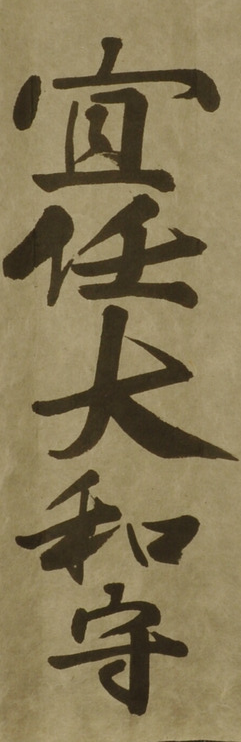宜任大和守
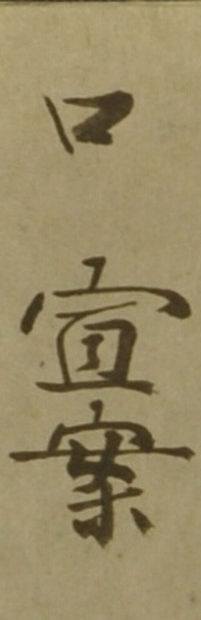口宣案

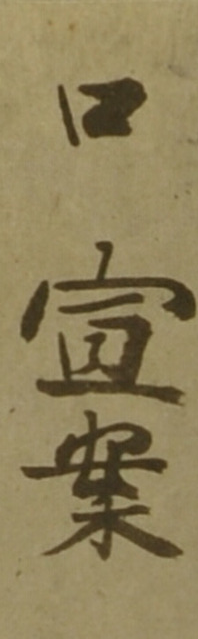口宣案
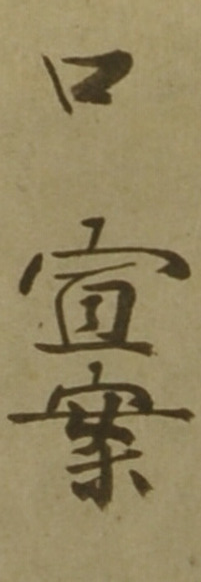口宣案

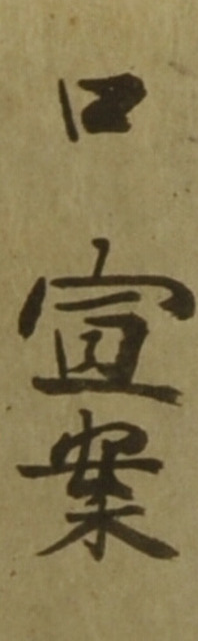口宣案
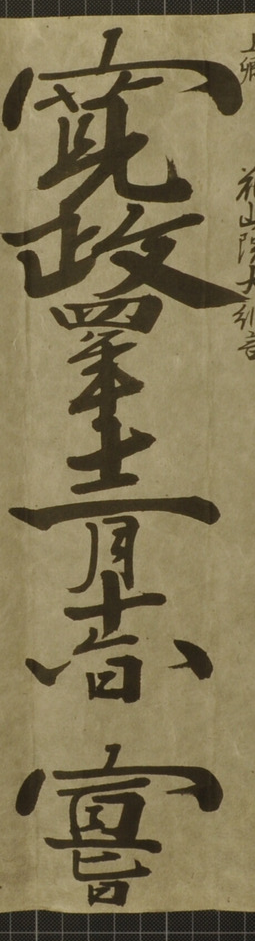寛政四年十二月十六日宣旨
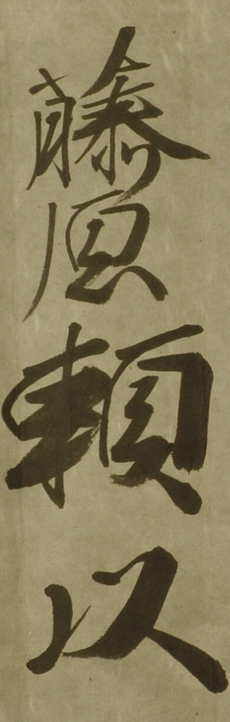藤原頼以
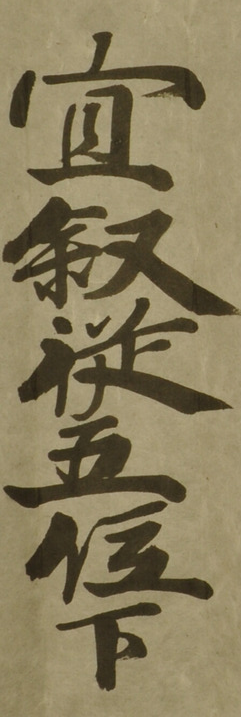宜叙従五位下

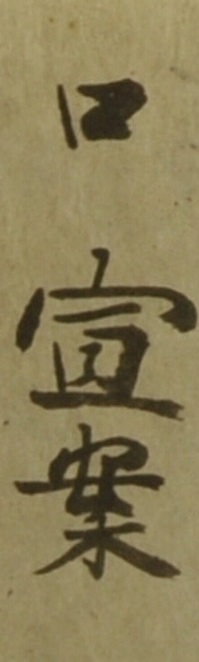口宣案
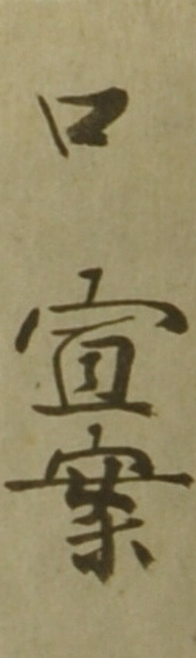口宣案
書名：口宣案
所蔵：伊那市立高遠町図書館・合同会社AMANE
